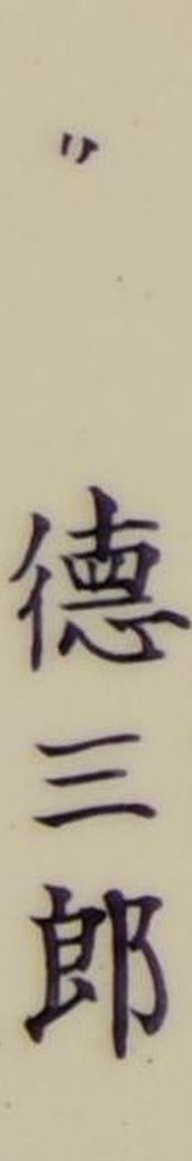徳三郎
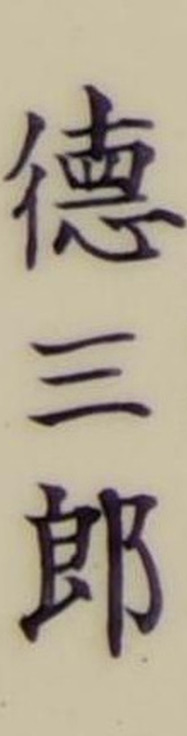徳三郎

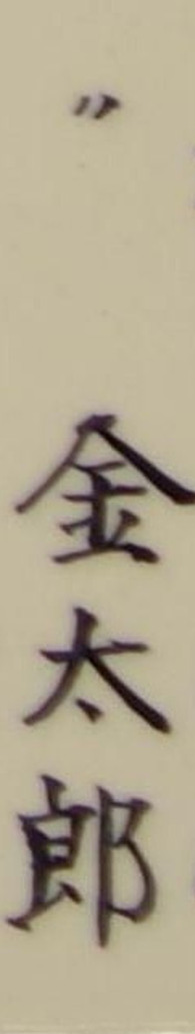金太郎
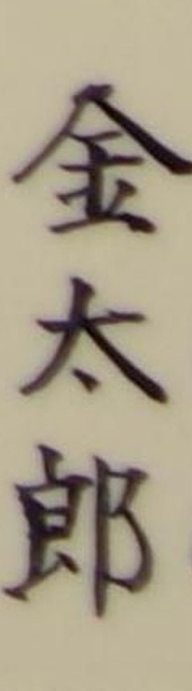金太郎
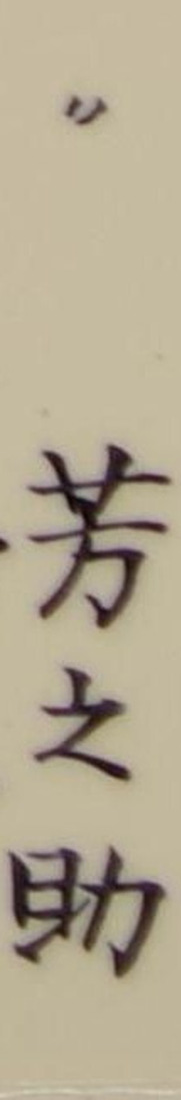芳之助
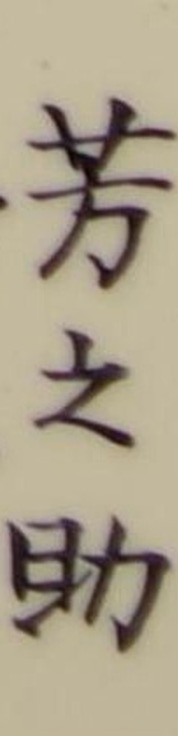芳之助
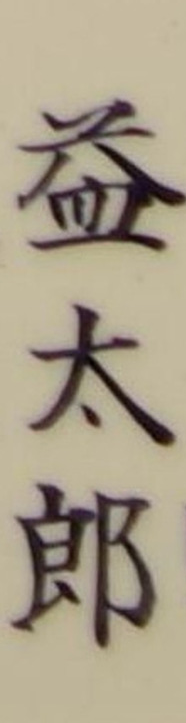益太郎
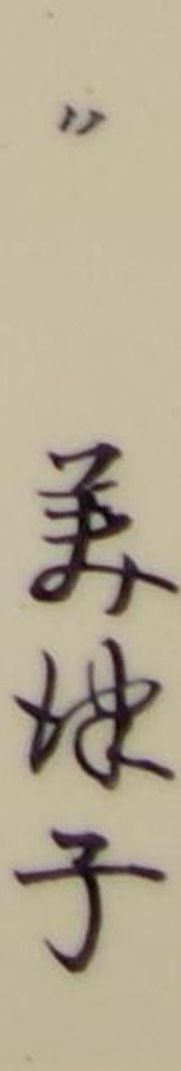美津子
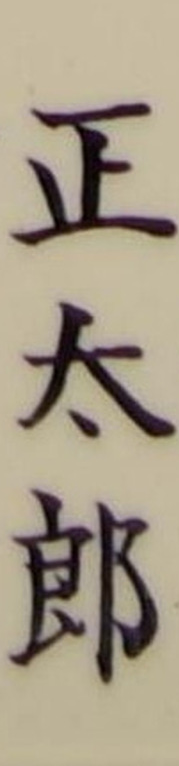正太郎
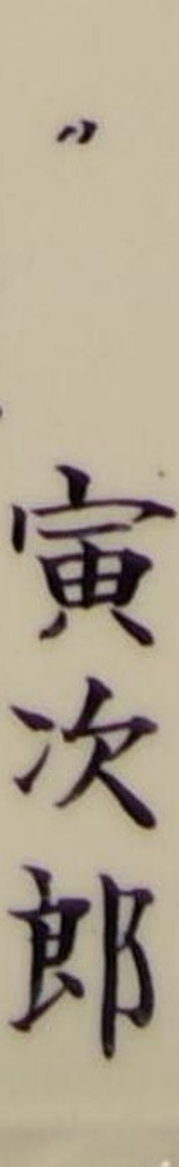寅次郎
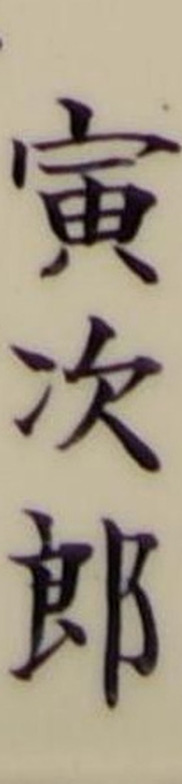寅次郎
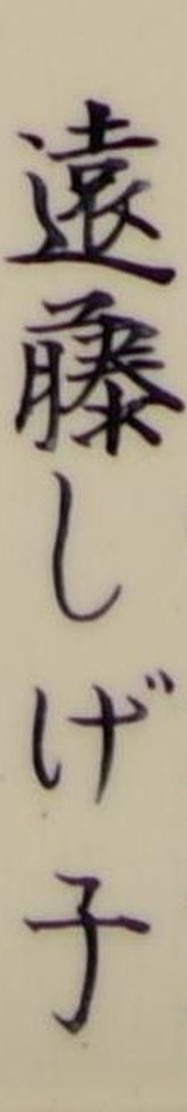遠藤しげ子
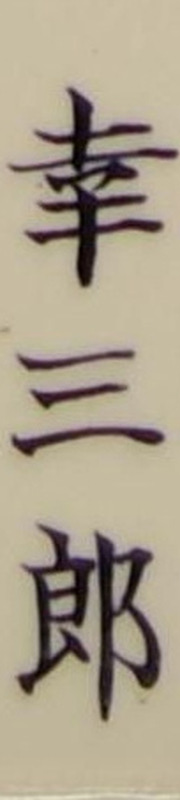幸三郎

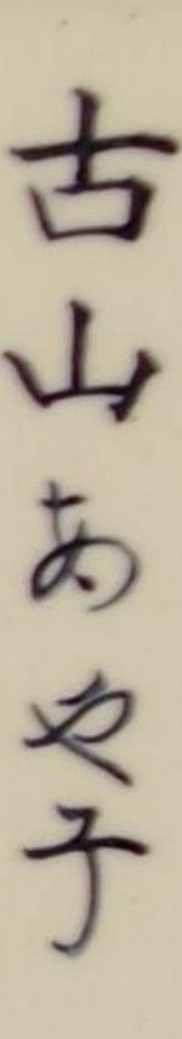古山あや子
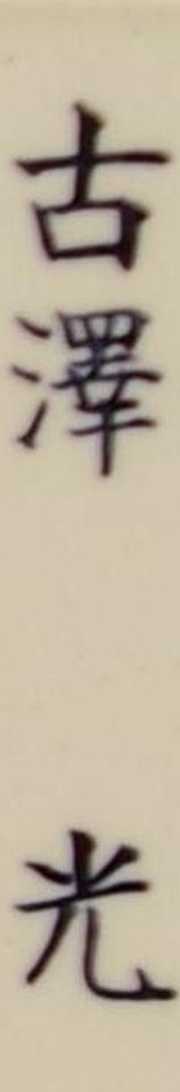古澤光
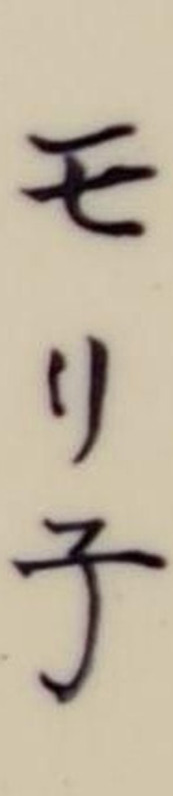モリ子
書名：E~L
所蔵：高野山金剛峯寺
